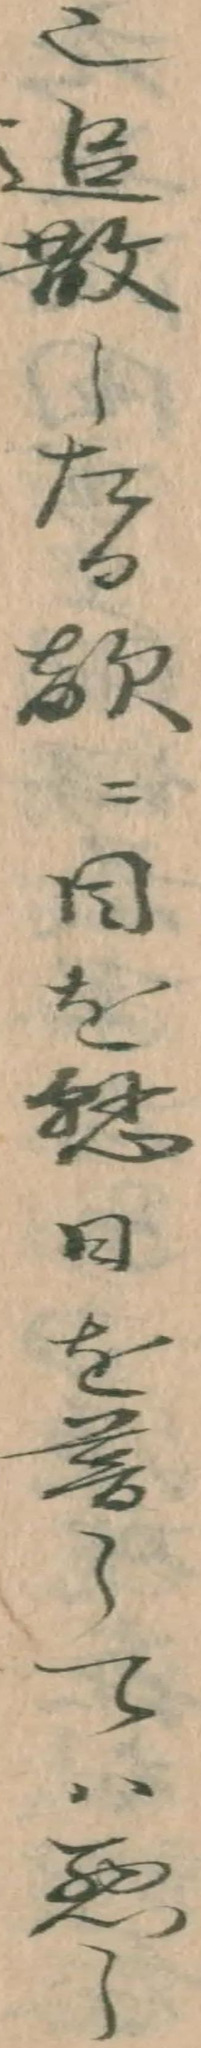也追散したる敵に目を懸日を暮しては悪し
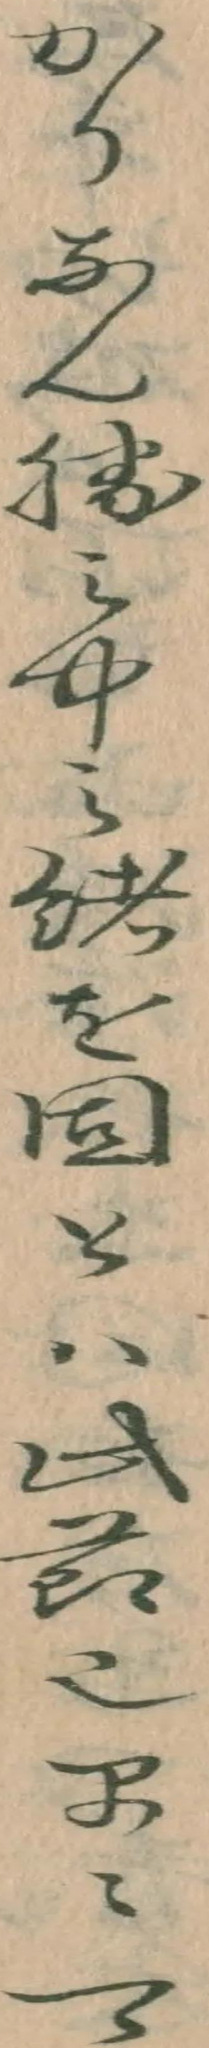かりなん勝之中之緒を固とは此節也早々可
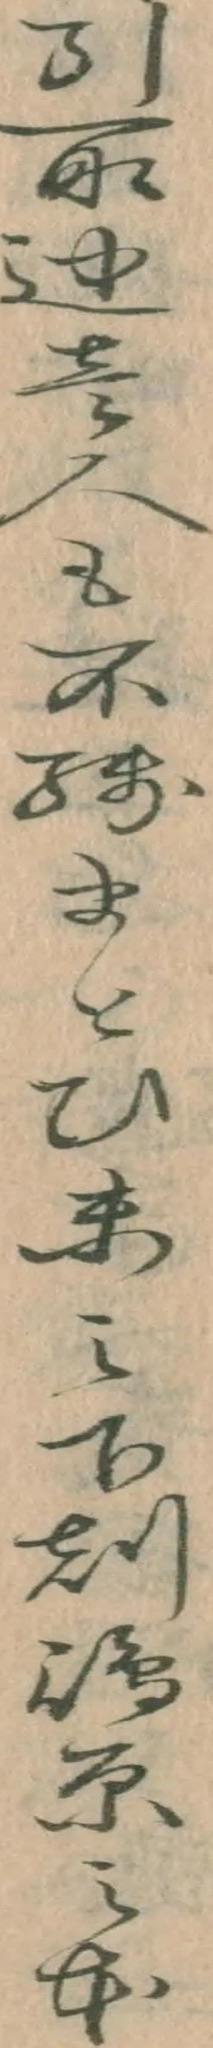引取迚壱人も不残まとひ未之下刻島原之本
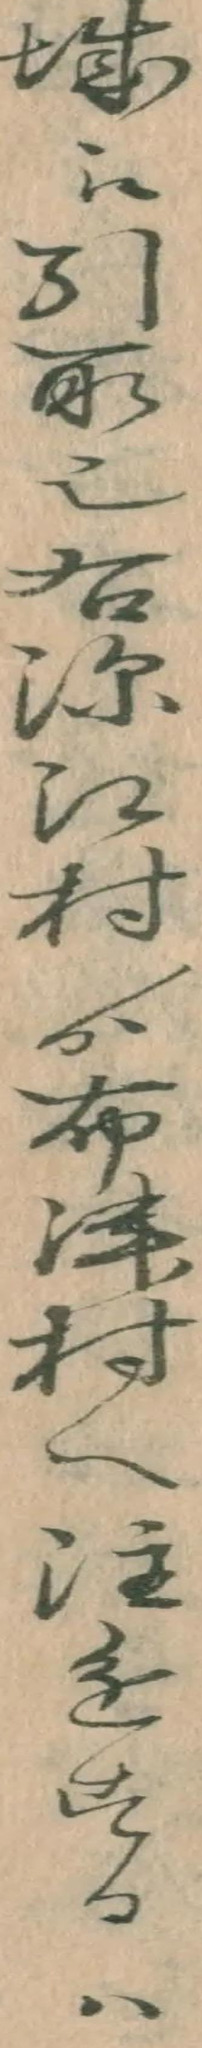城え引取也右深江村ゟ布津村へ注進するは
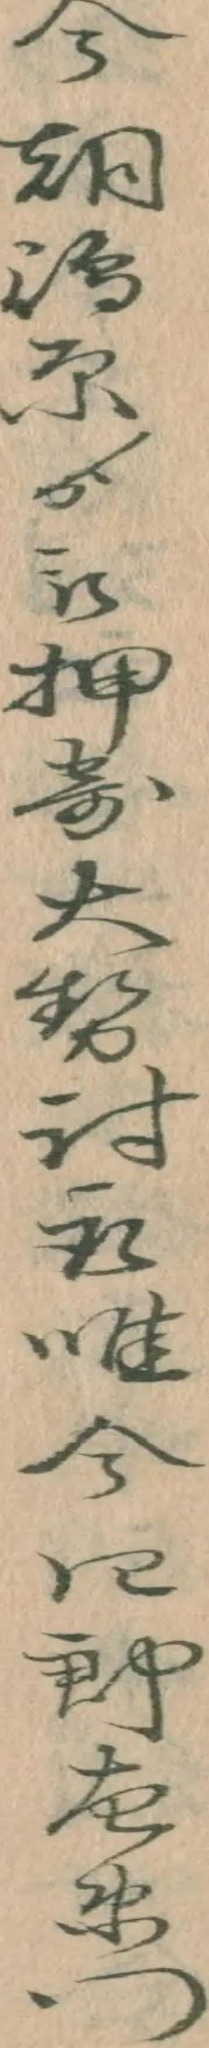今朝島原ゟ被押寄大勢討取唯今四郎左衛門
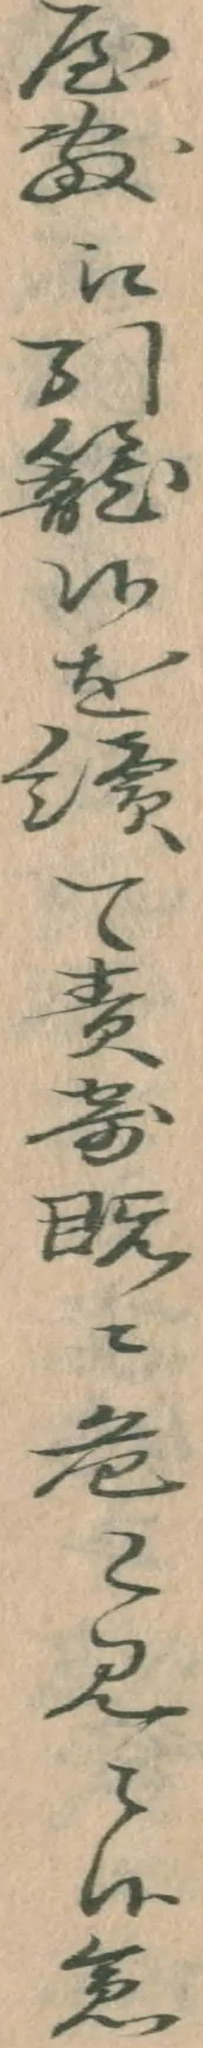屋敷え引籠候を続て責寄盶に危く見て候急
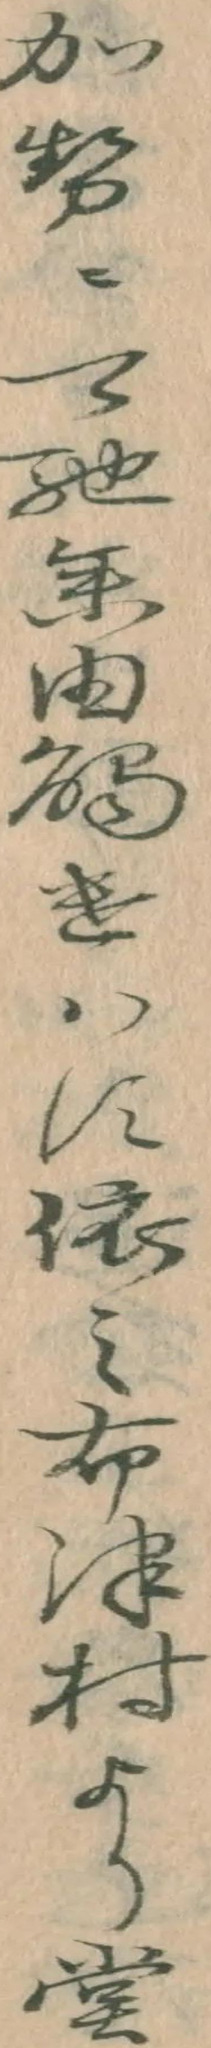加勢にて馳参由触遺はす依之布津村より堂
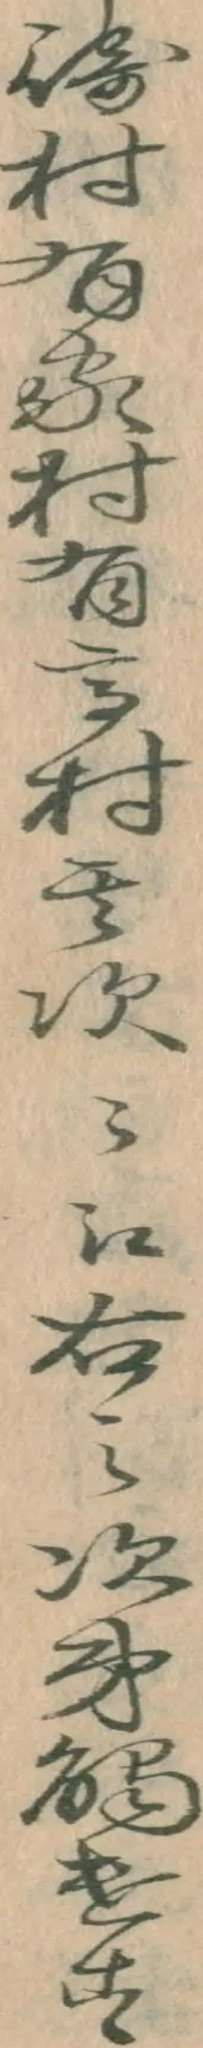崎村有家村有馬村其次々え右之次第触遣す
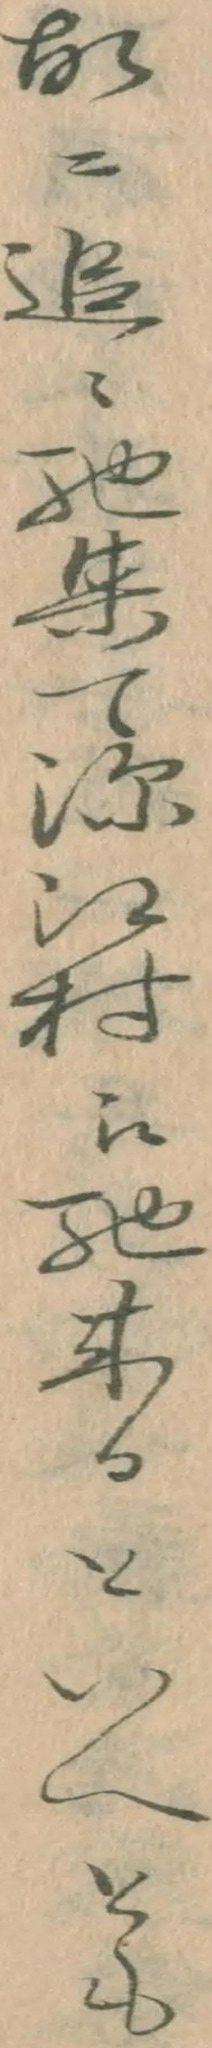故に追々馳集て深江村え馳来るといへとも

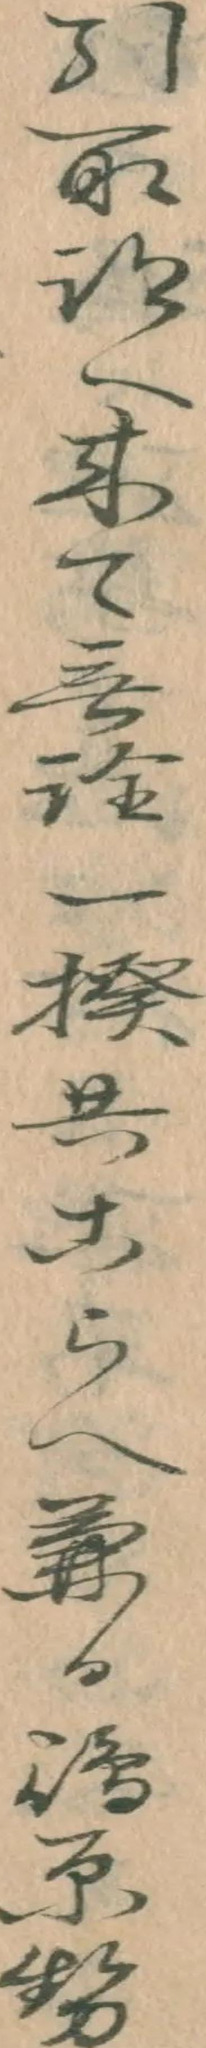引取跡へ来て無詮一揆共こらへ兼る島原勢
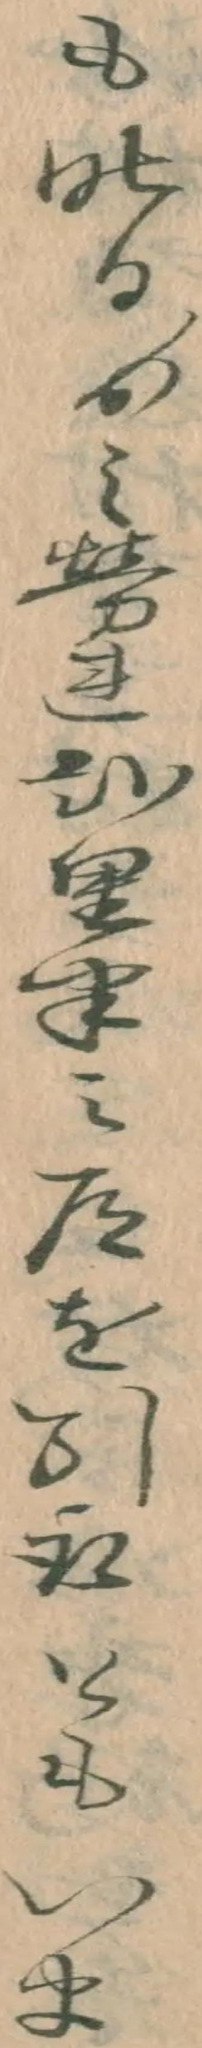も昨日ゟ之労れ弐里半之道を引取ともいま
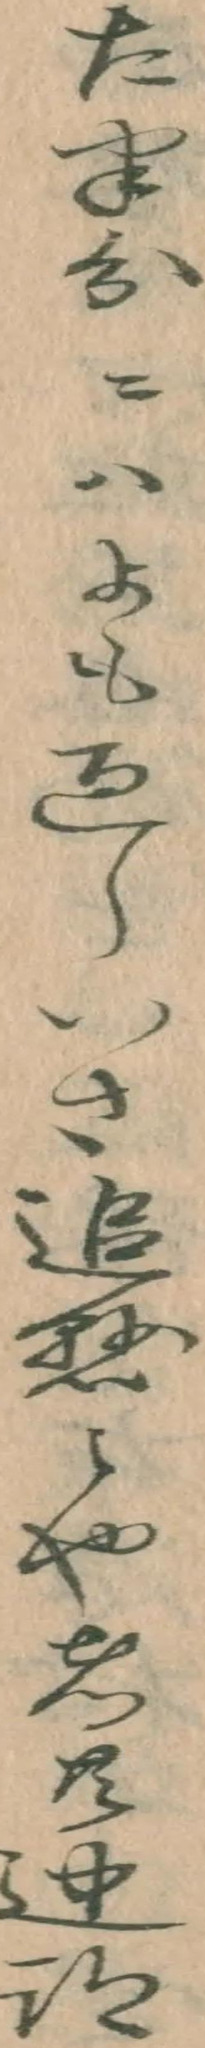た半分にはよも過しいさ追懸てや者共迚跡
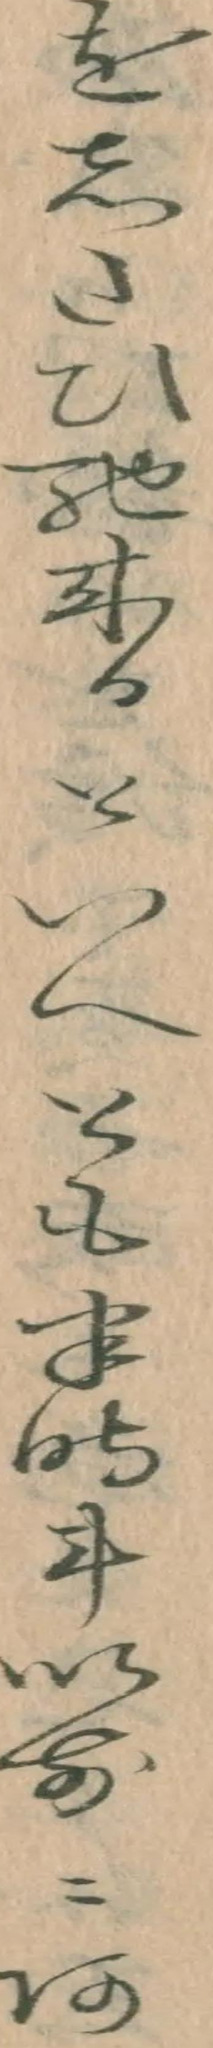をしたひ馳来るといへとも半時斗以前にあ
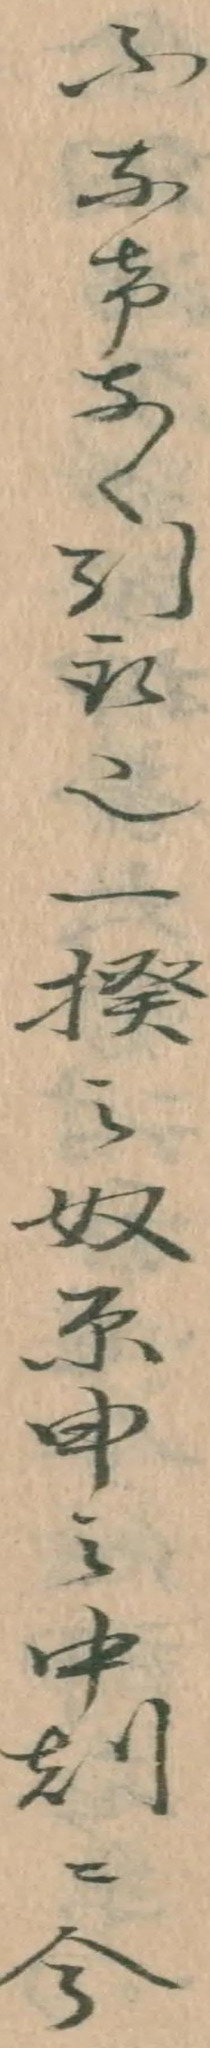ふなけなく引取也一揆之奴原申之中刻に今
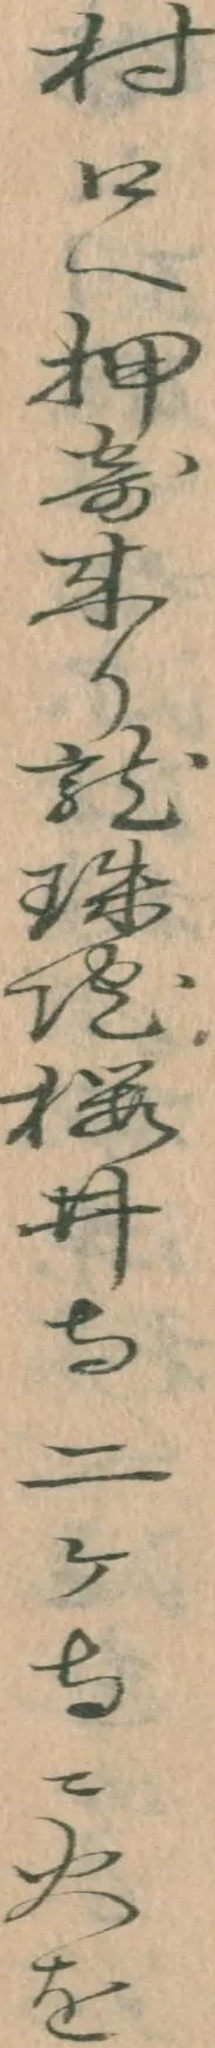村口へ押寄来り龍珠院桜井寺二ヶ寺に火を
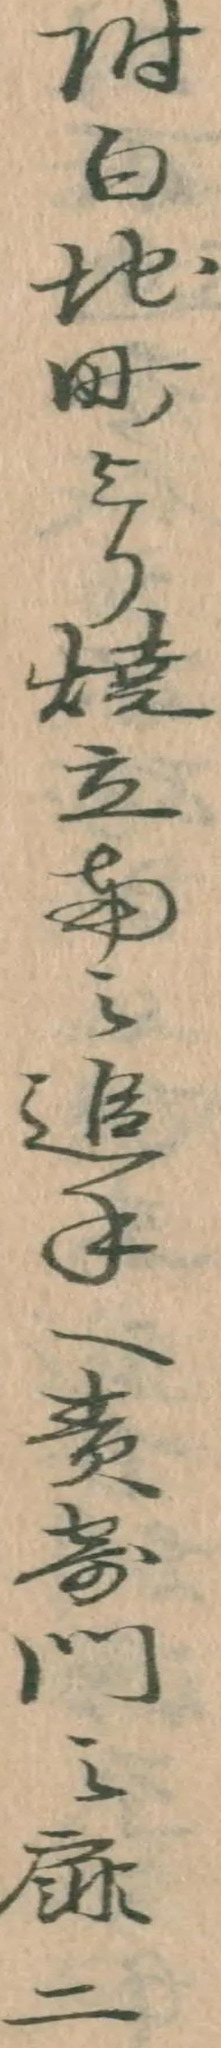附白地町より焼立南之追手へ責寄門之扉二
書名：切支丹御退治記 49巻. [1]
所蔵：国立国会図書館 National Diet Library, JAPAN
